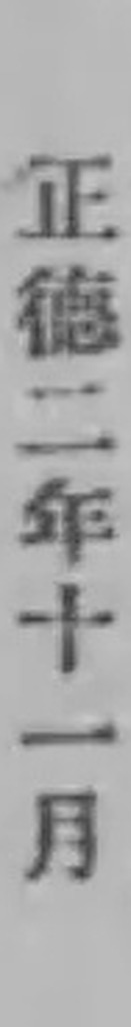正徳二年十一月
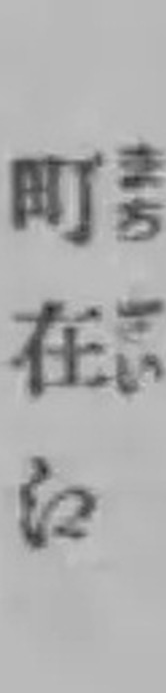町在え
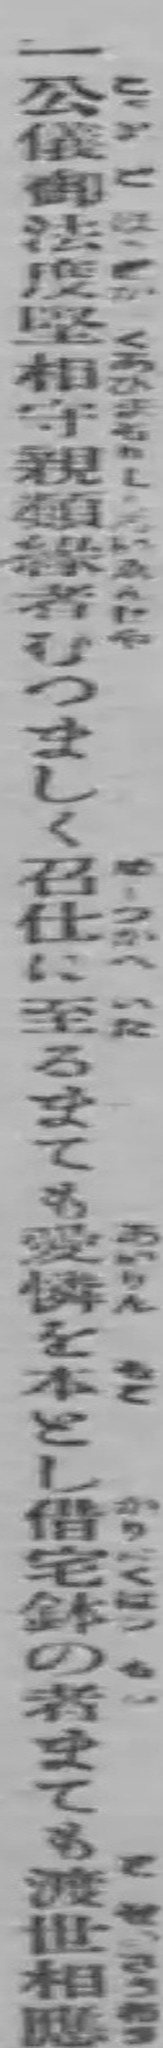一公儀御法度堅相守親類縁者むつましく召仕に至るまても愛憐を本とし借宅鉢の者まても渡世相応
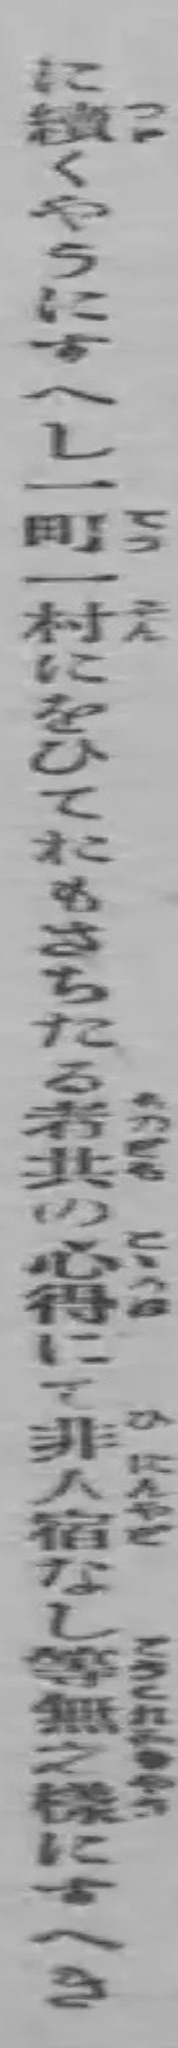に続くやうにすへし一町一村にをひておもさちたる者共の心得にて非人宿なし等無之様にすへき
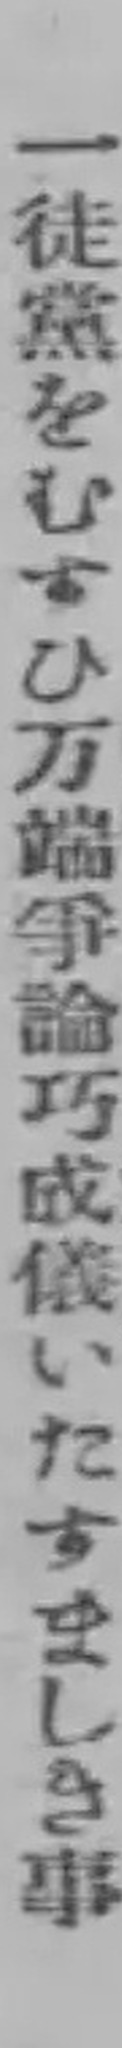一徒党むすひ万端争論功成儀いたすましき事
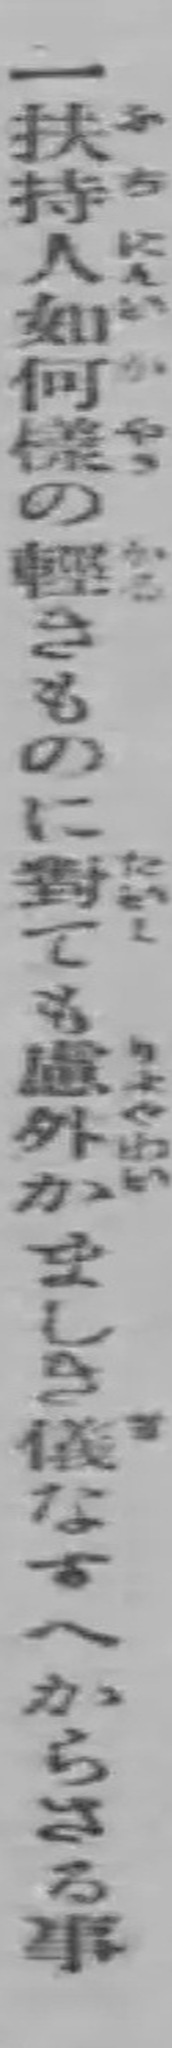一扶持人如何様の軽きものに対ても慮外かましき儀なすへからさる事
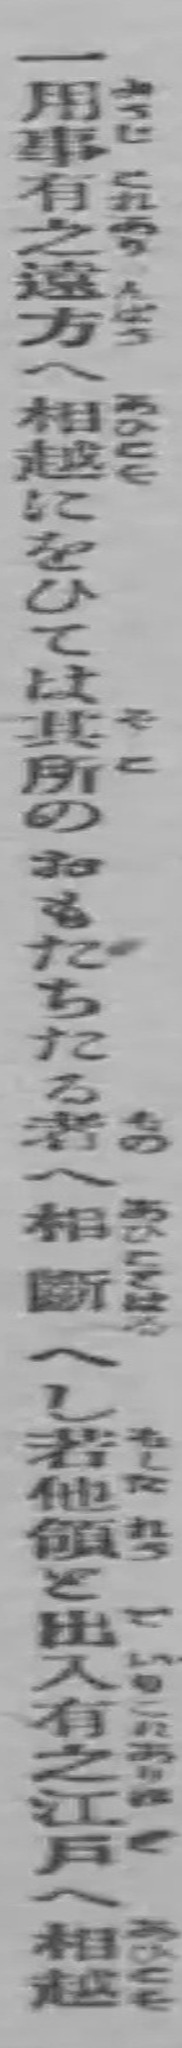一用事有之遠方へ相越にをひては其所のおもたちたる者へ相断へし若他領と出入有之江戸へ相越
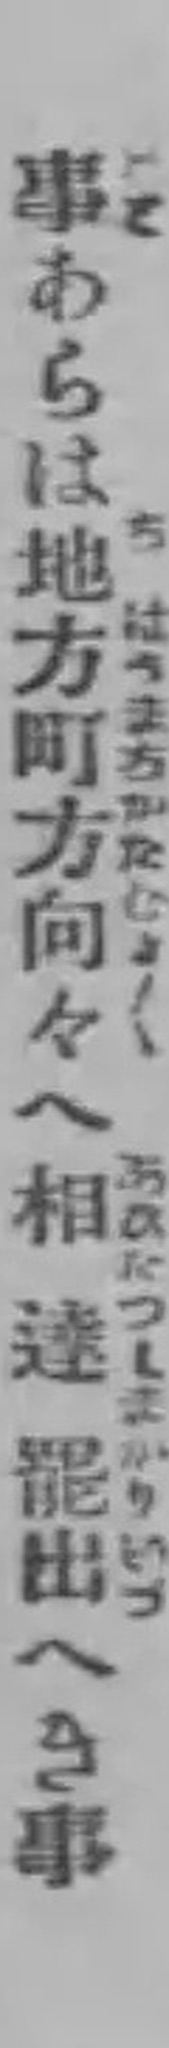事あらは地方町方向々へ相達罷出へき事
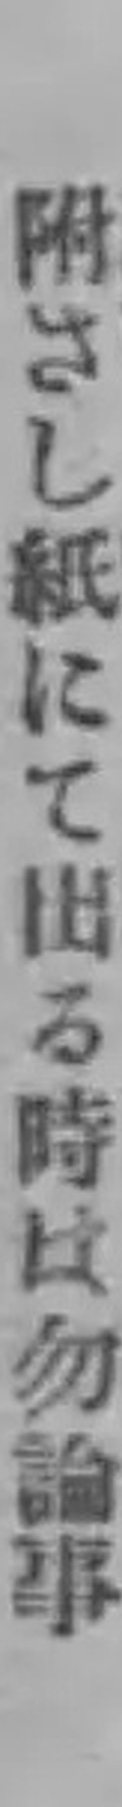附さし紙にて出る時は勿論事

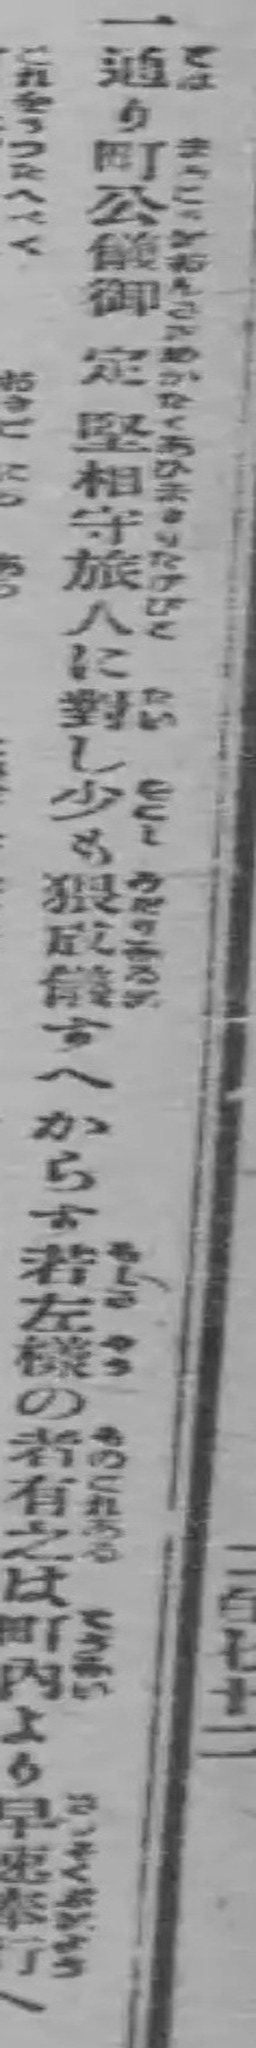一通り町公儀御定堅相守旅人に対し少も猥成儀すへからす若左様の者有之は町内より早速奉行へ
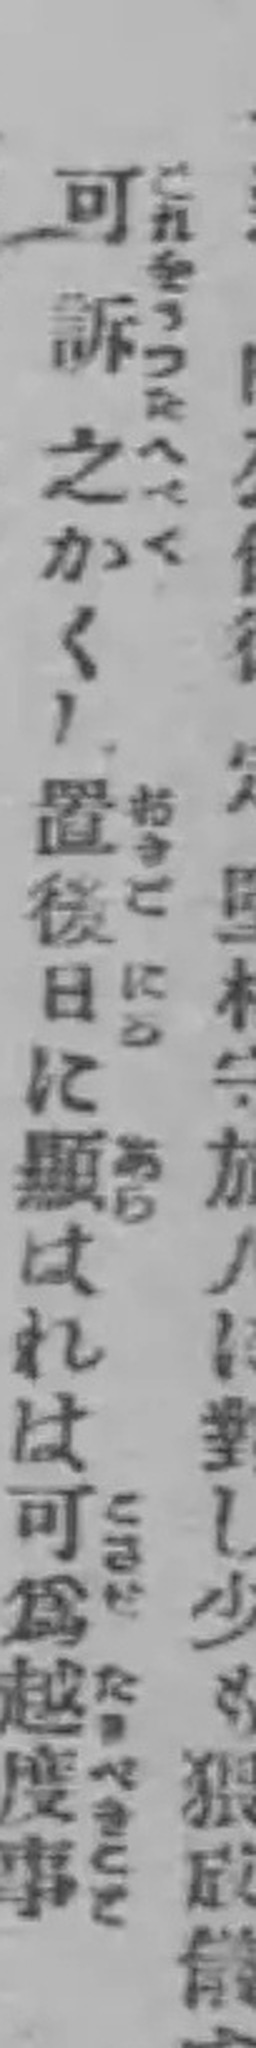可訴之かくし置後日に顕はれは可為越度事
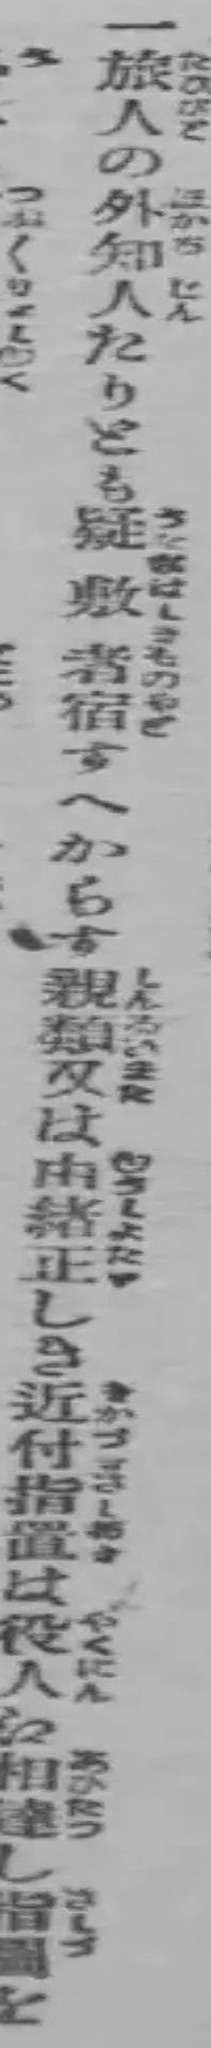一旅人の外知人たりとも疑敷者宿すへからす親類又は由緒正しき近付指置は役人え相達し指図を
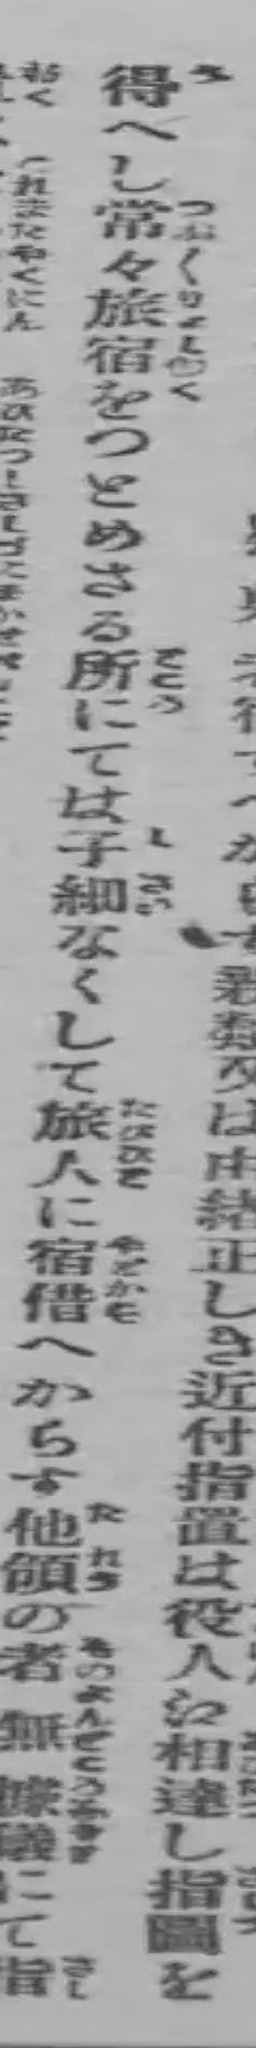得へし常々旅宿をつとめさる所にては子細なくして旅人に宿借へからす他領の者無拠儀にて指
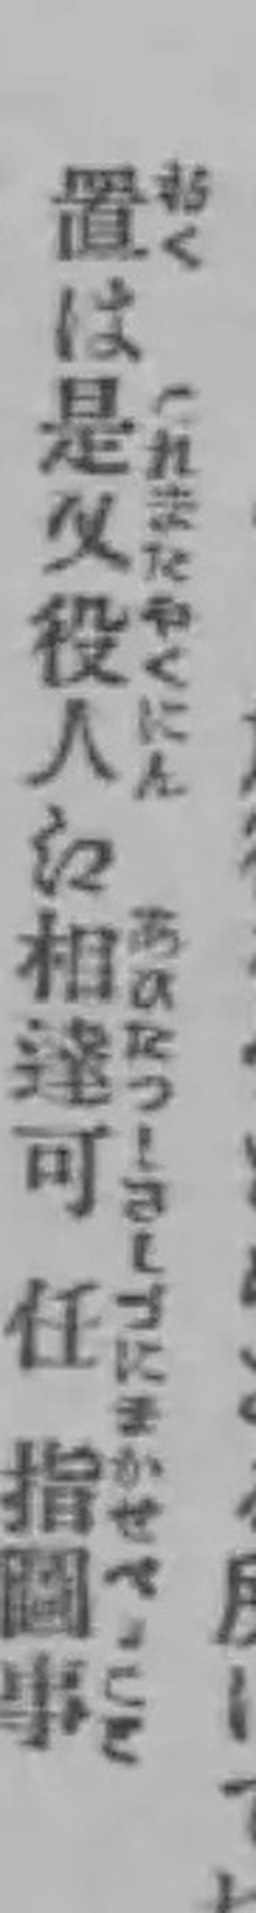置は是又役人え相達可任指図事
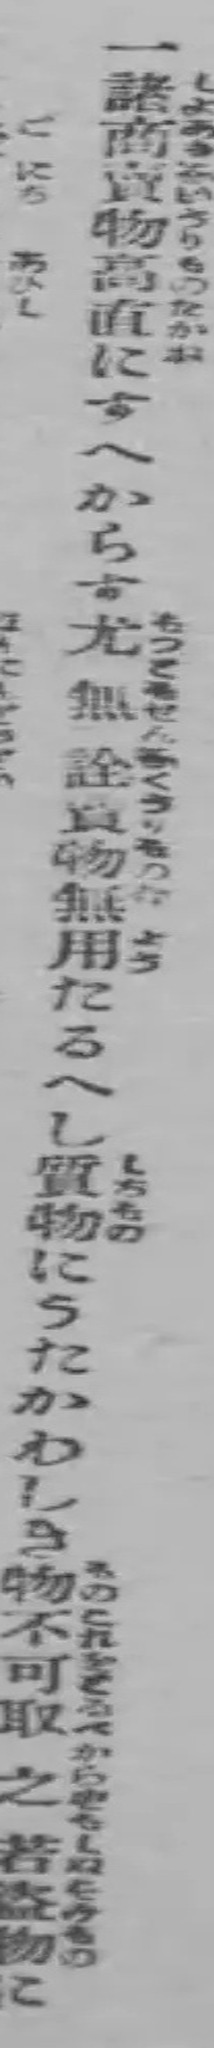一諸商売物高直にすへからす尤無詮売物無用たるへし質物にうたかわしき物不可取之若盗物に
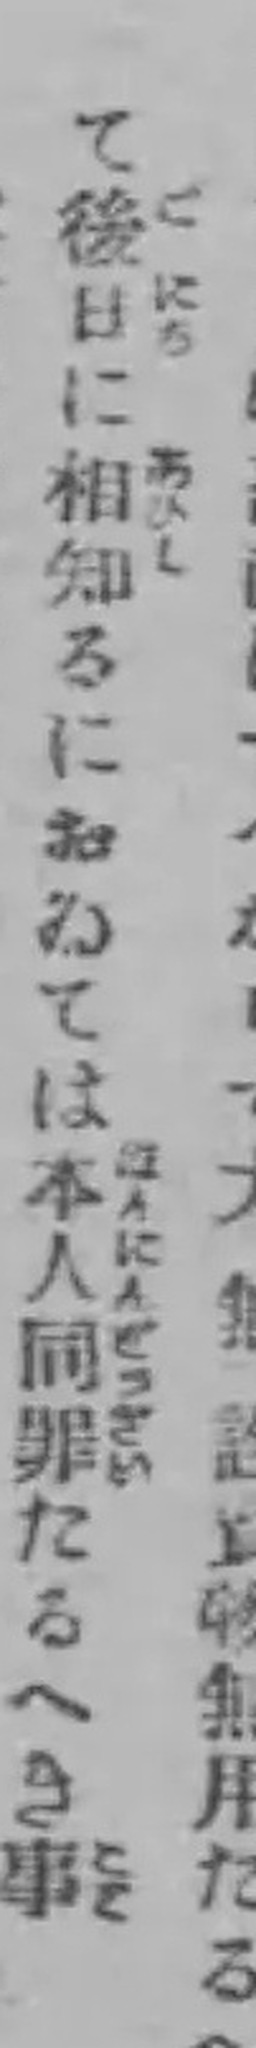て後日に相知るにおゐては本人同罪たるへき事
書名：豊橋市史談
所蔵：国立国会図書館 National Diet Library, JAPAN
